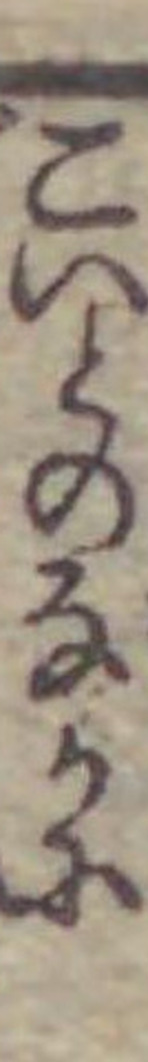こいとのなかに
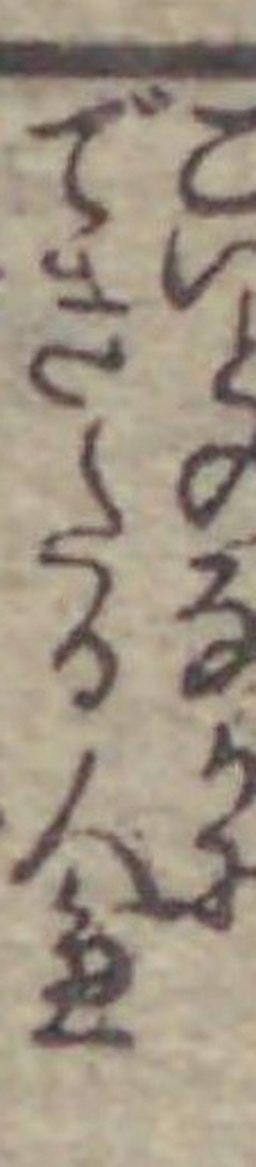できたる人魚
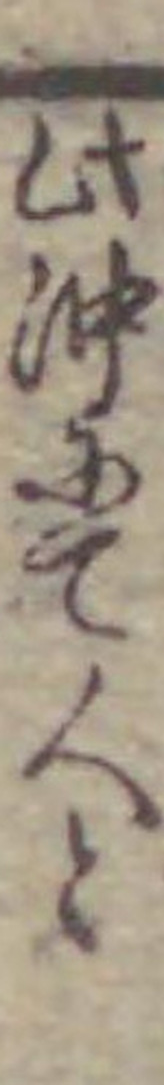此沖にて人と
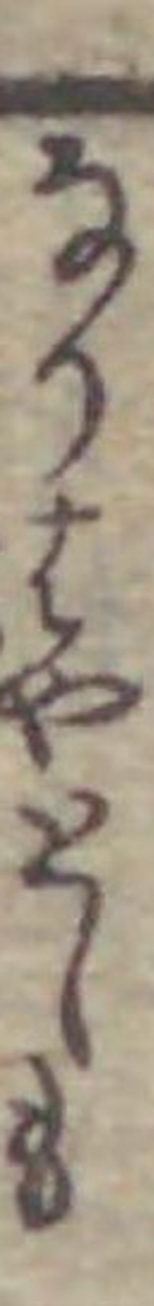なりはやとしも
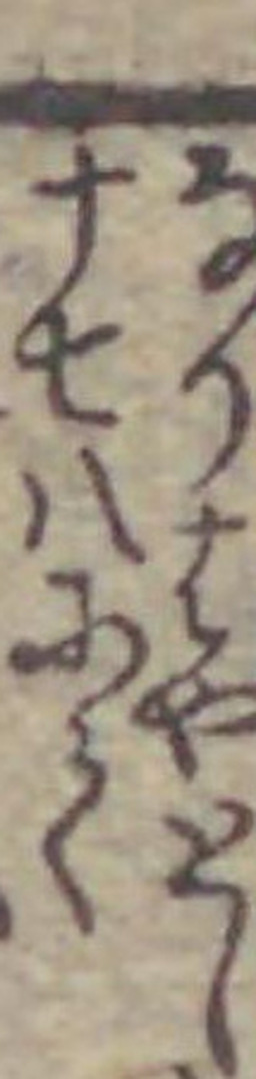十七八にて
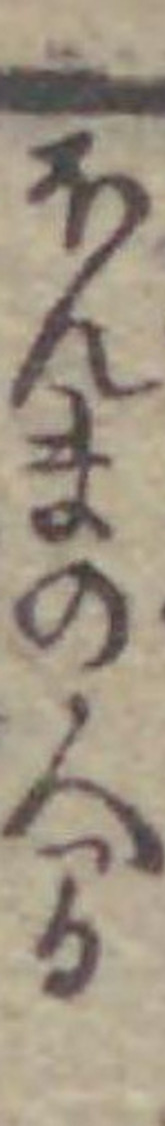ほんまの人間
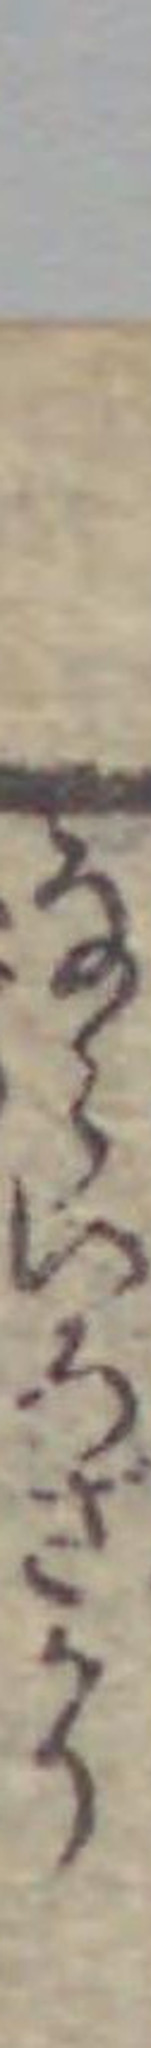ならいろざかり
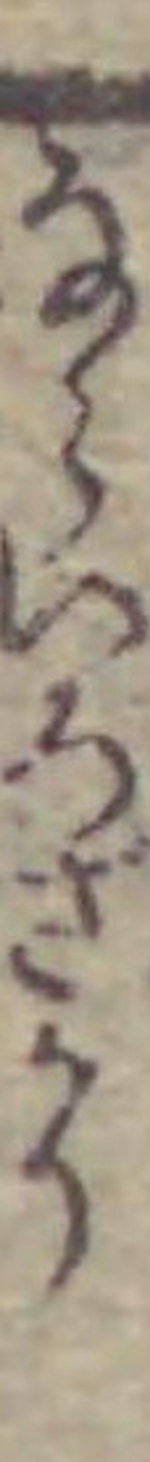ならいろざかり
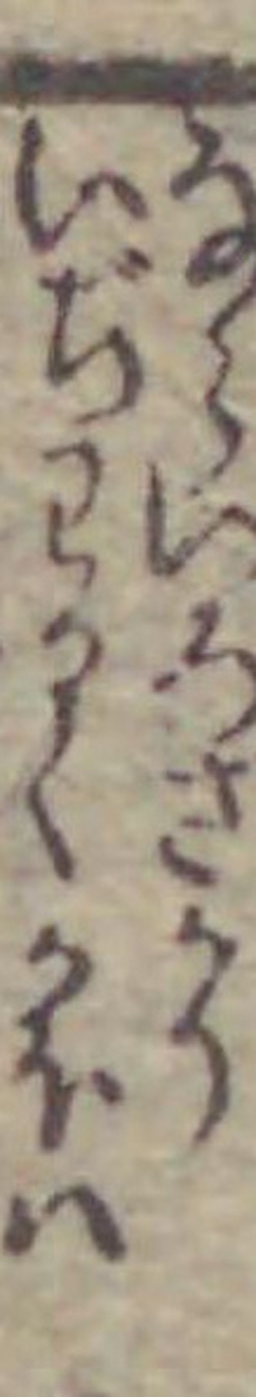いぢわるくかほは
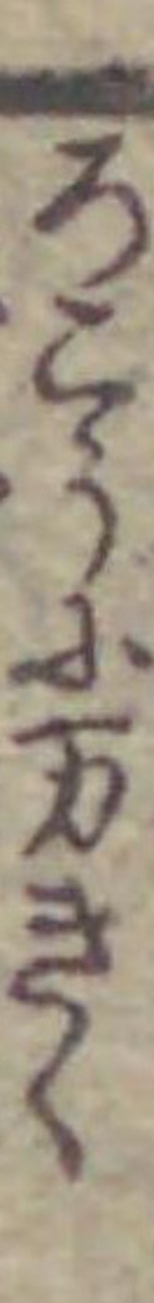ろこうに万きく
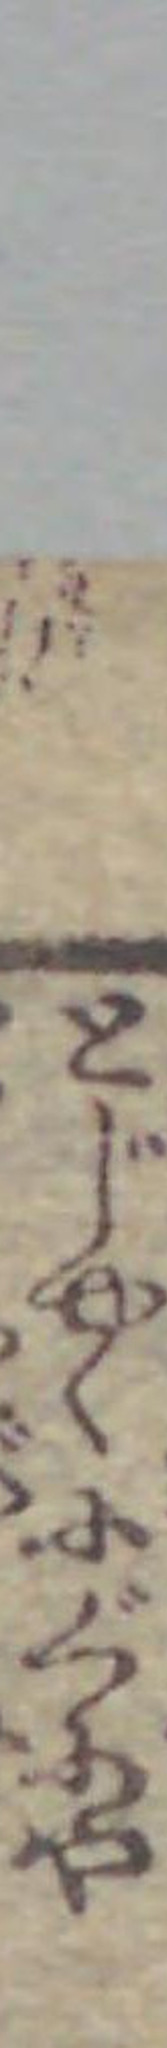とじやくにぐにや
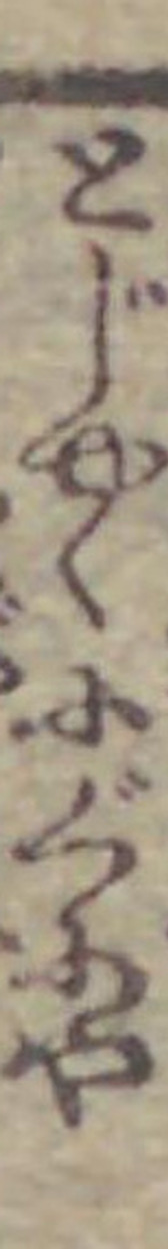とじやくにぐにや
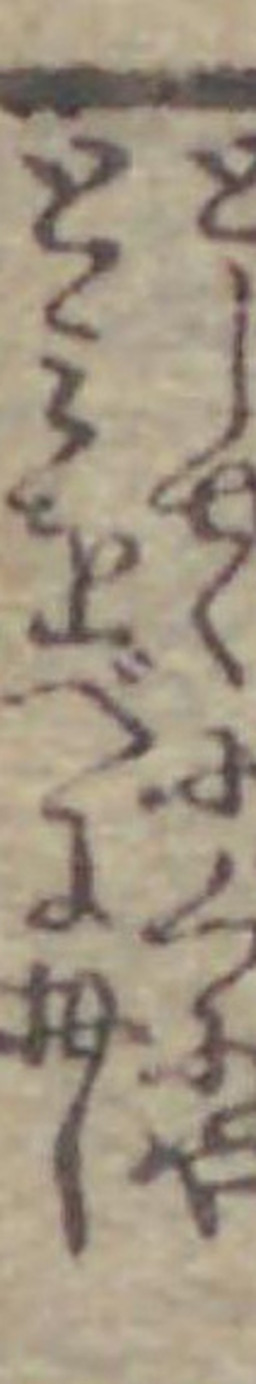とみをべにおし
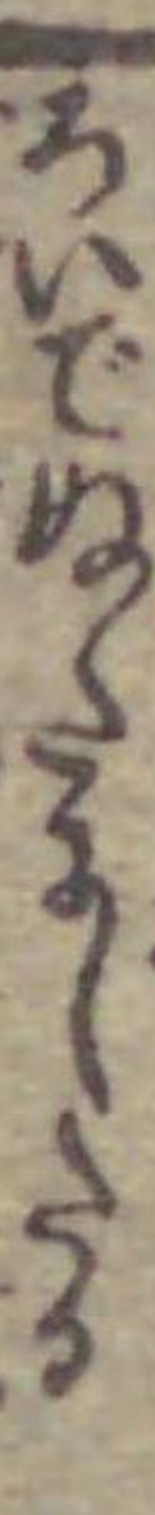ろいでぬたにしたる
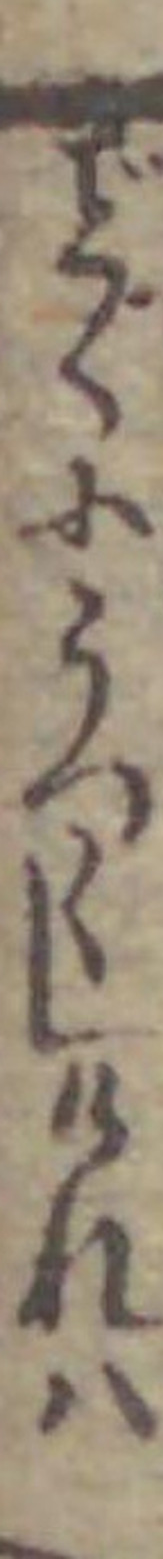ごとくにうつくしけれは
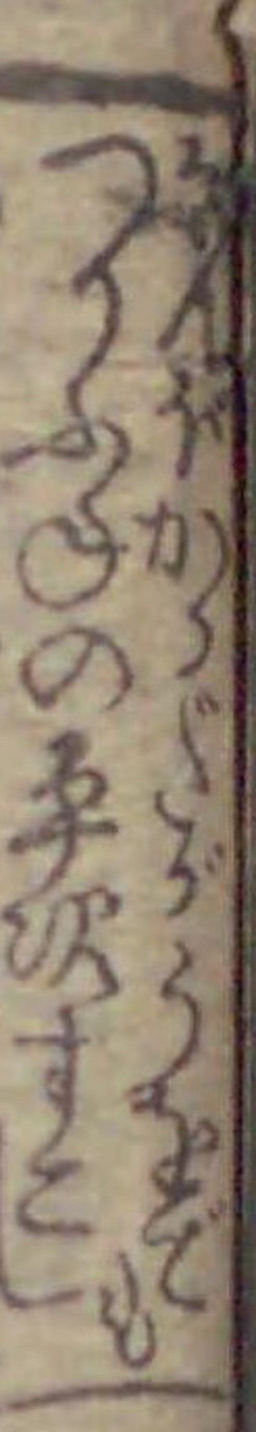つりふねの平次すこし
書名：箱入娘面屋人魚 3巻
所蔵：国立国会図書館 National Diet Library, JAPAN
